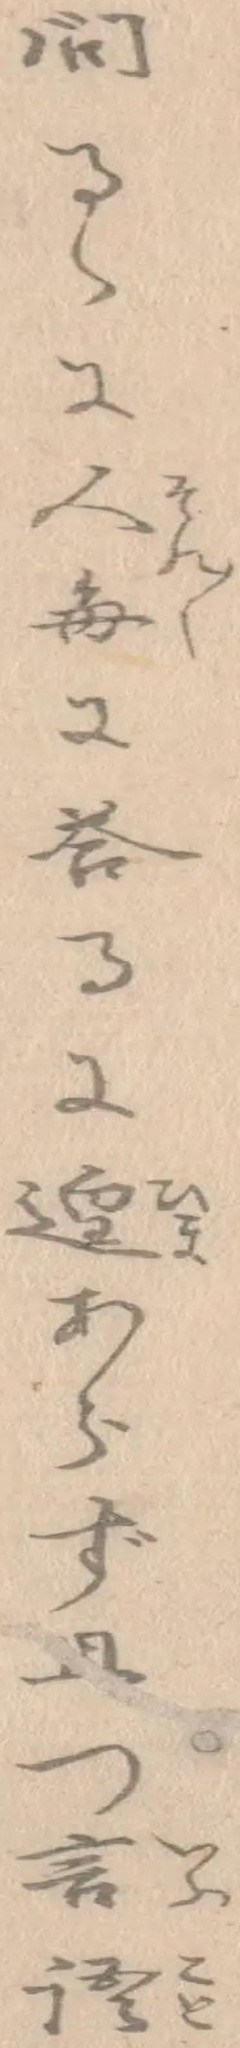問るゝに人毎に答るに迎あらず且つ言語
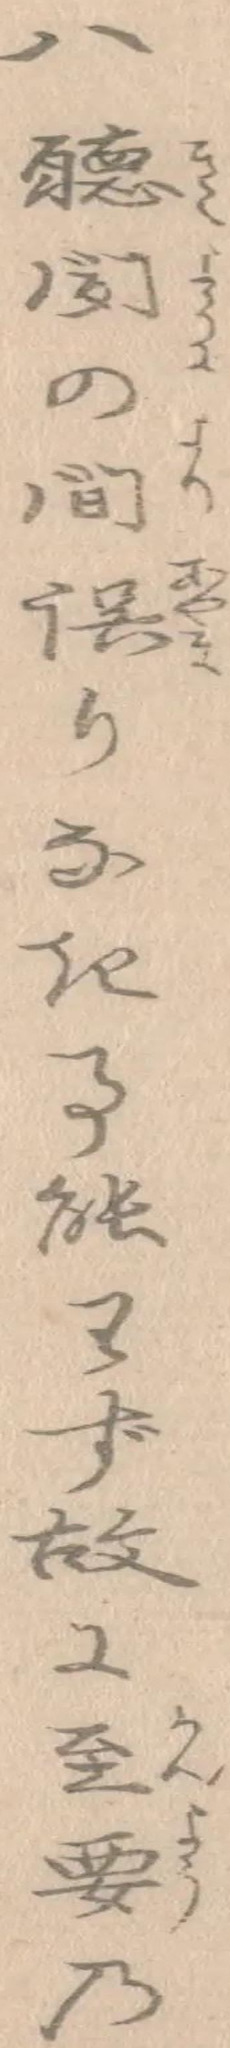は聴聞の間誤りなき事能わず故に至要の
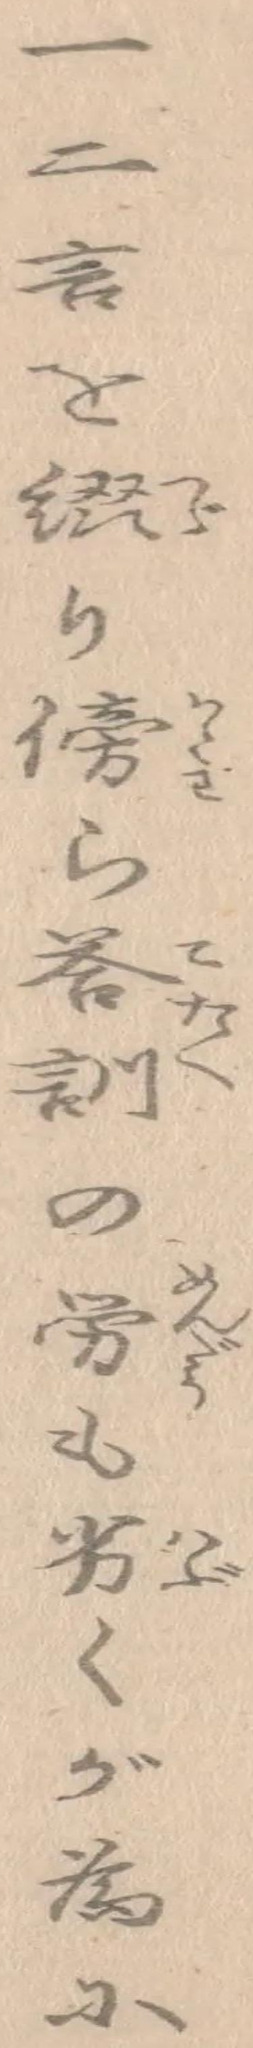一二言を綴り傍ら答訓の労も劣くが為に
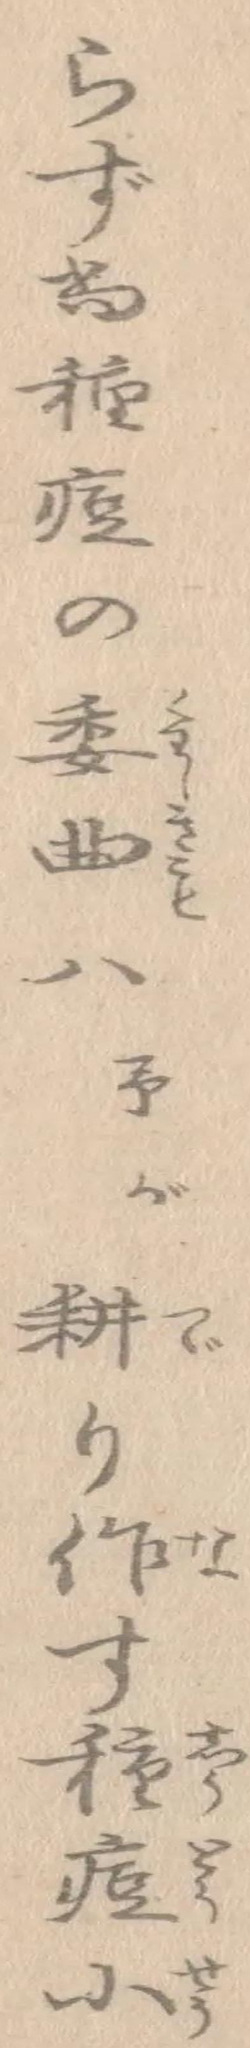らず尚種痘の委曲は予が耕り作す種痘に
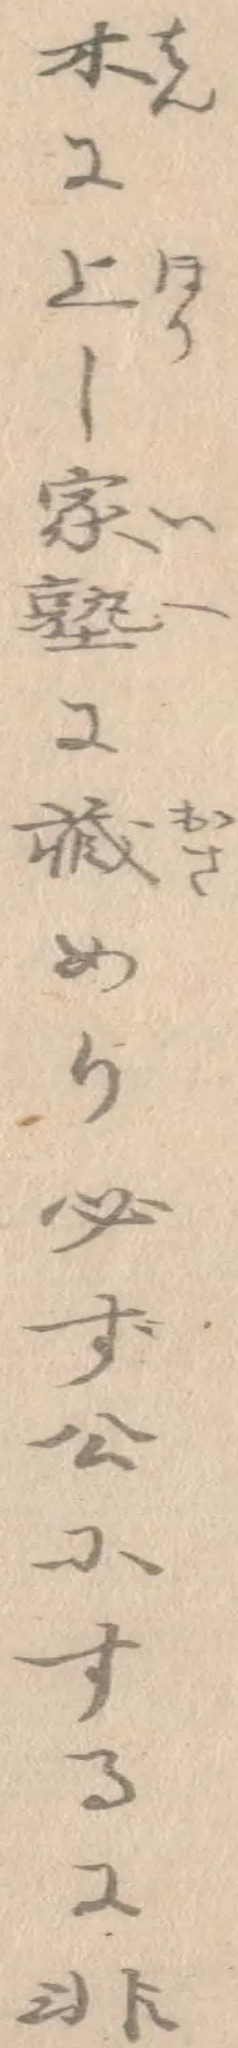木に上し家塾に蔵めり必ず公にするに非
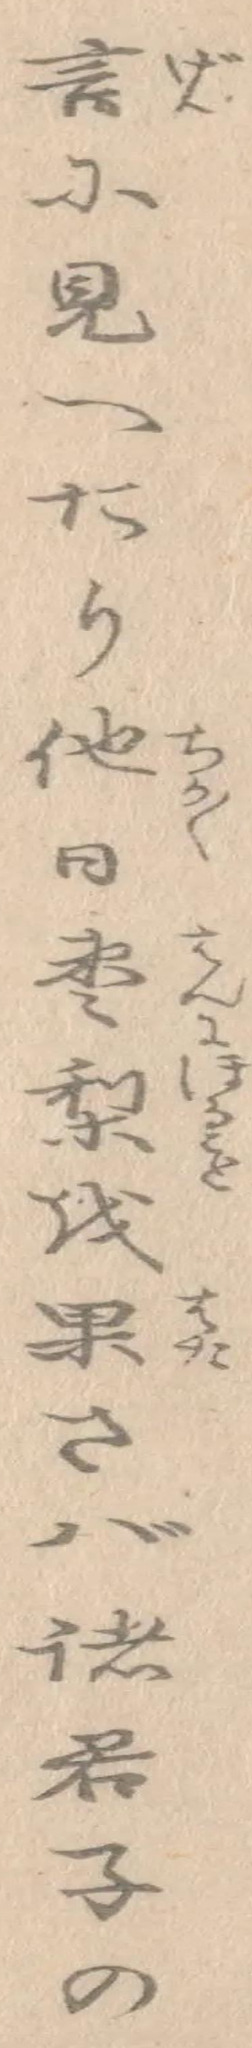言に見へたり他日夜々梨を果さば諸君子の
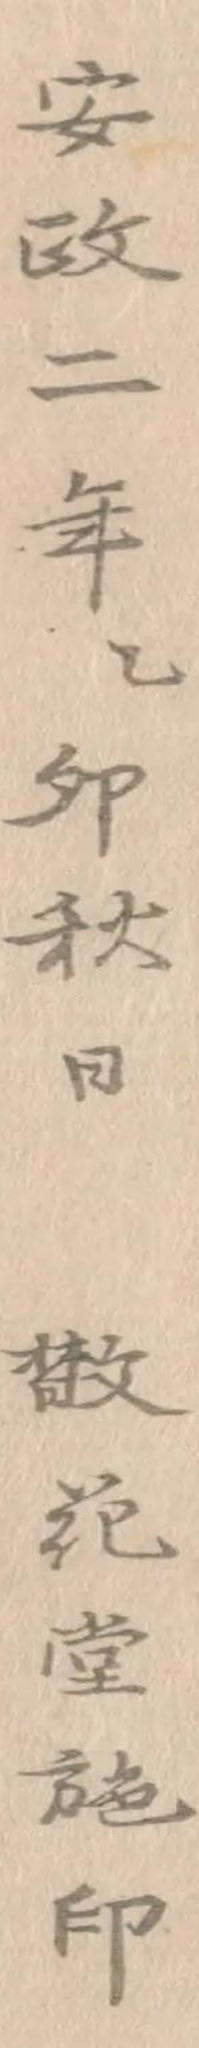安政二年未巳外秋日散花堂施印
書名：散花養生訓
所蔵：国立国会図書館 National Diet Library, JAPAN
